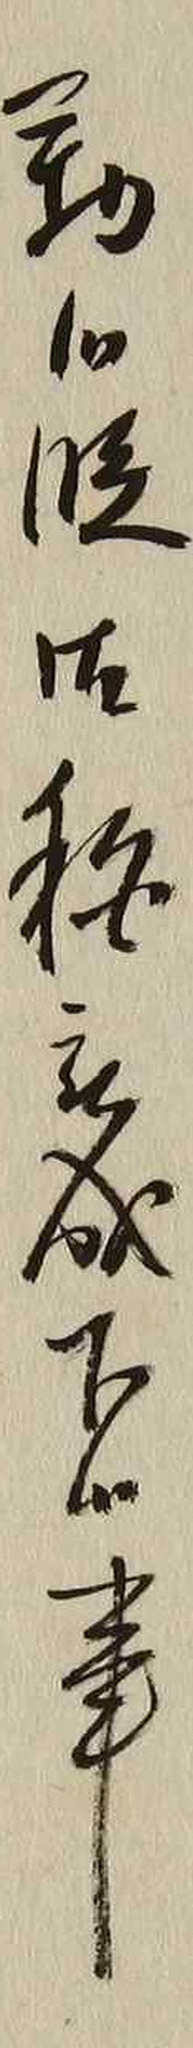勤候段御称被成下候事
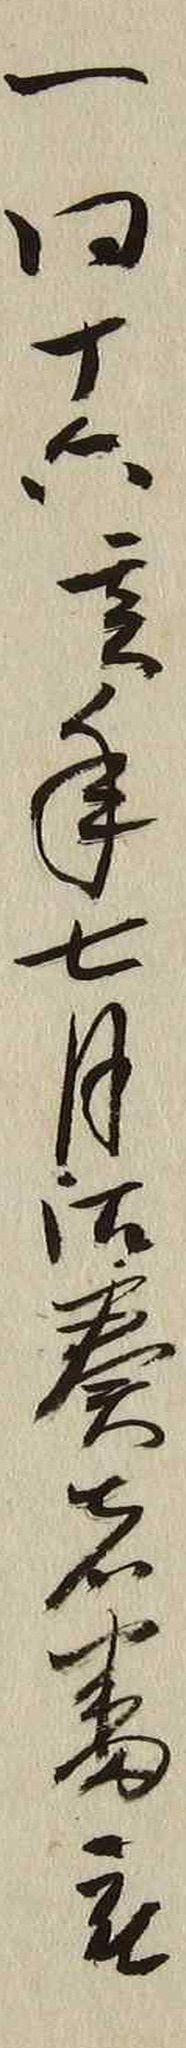一同十六亥年七月御奏者番被
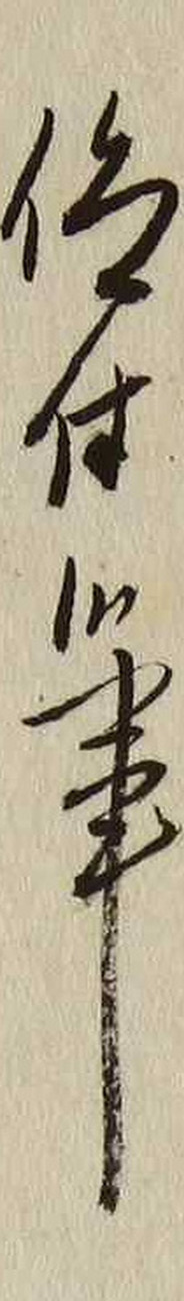仰付候事
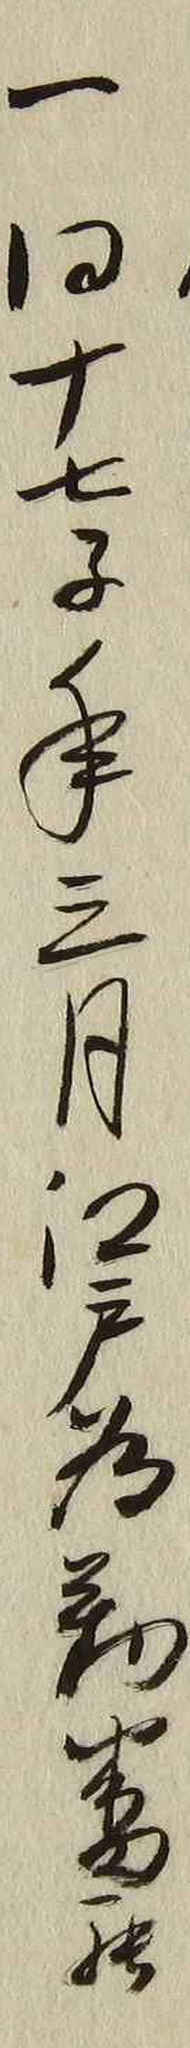一同十七子年三月江戸為勤番罷
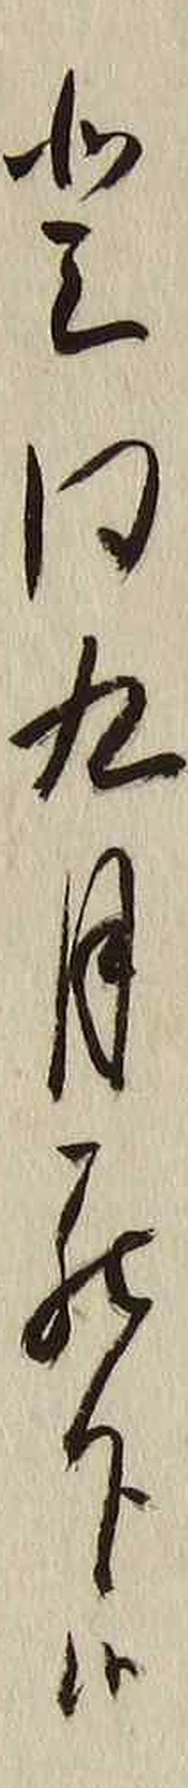登同九月罷下候
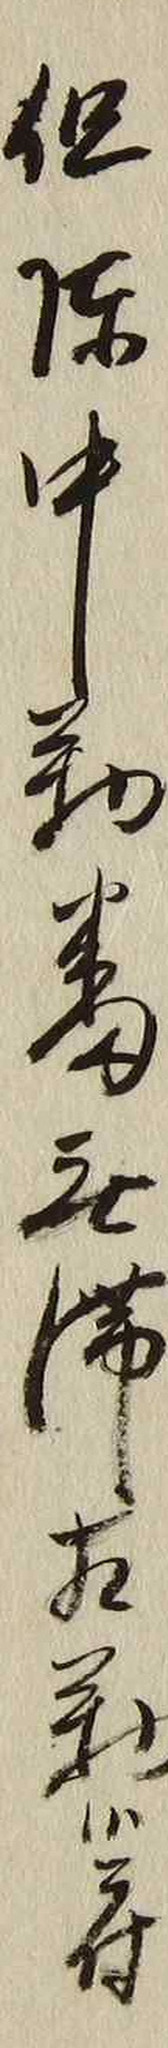但陣中勤番無滞相勤候ニ付
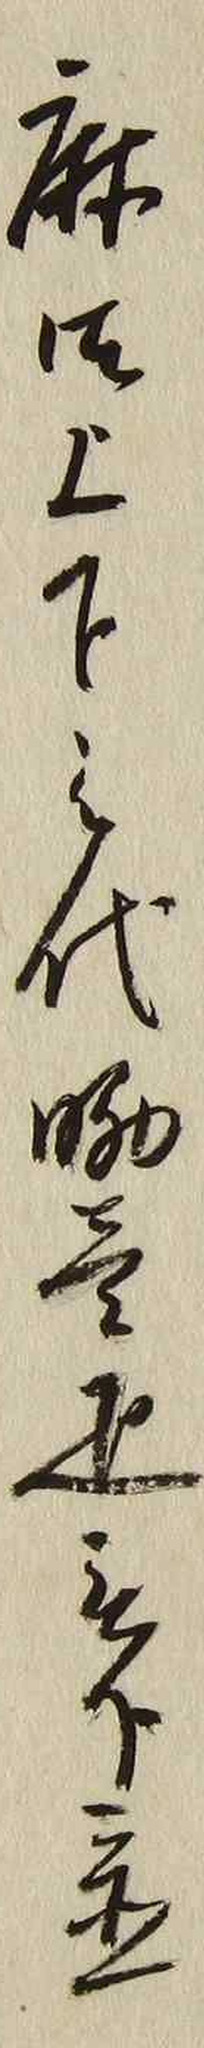麻御上下之代晒壱疋被下置
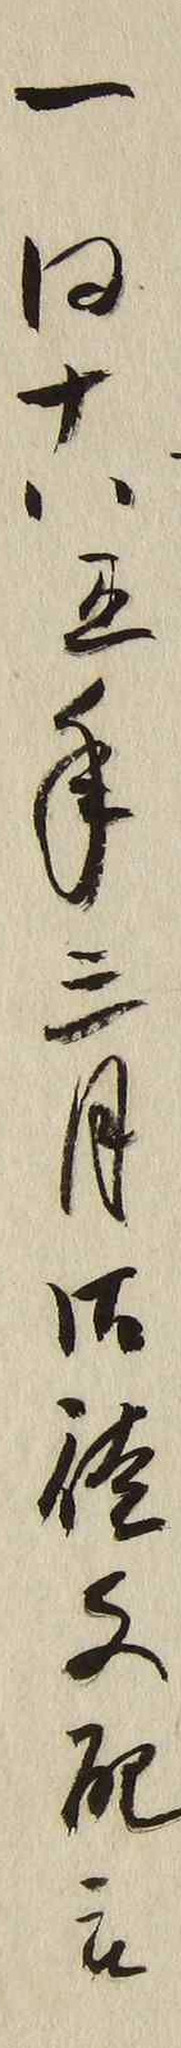一同十八丑年三月御徒支配被
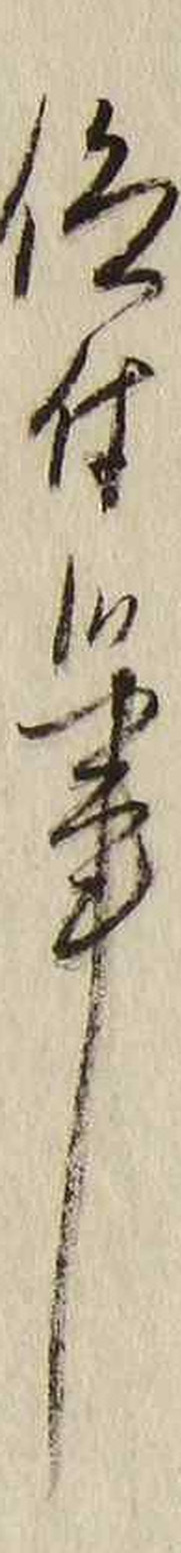仰付候事

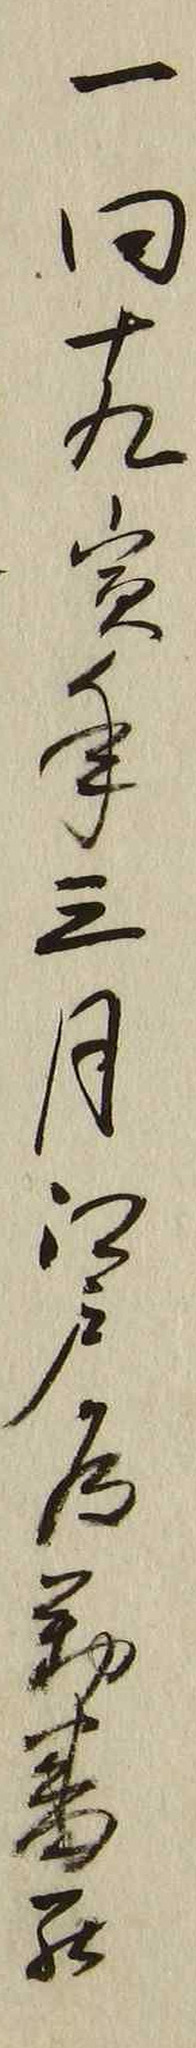一同十九寅年三月江戸為勤番罷
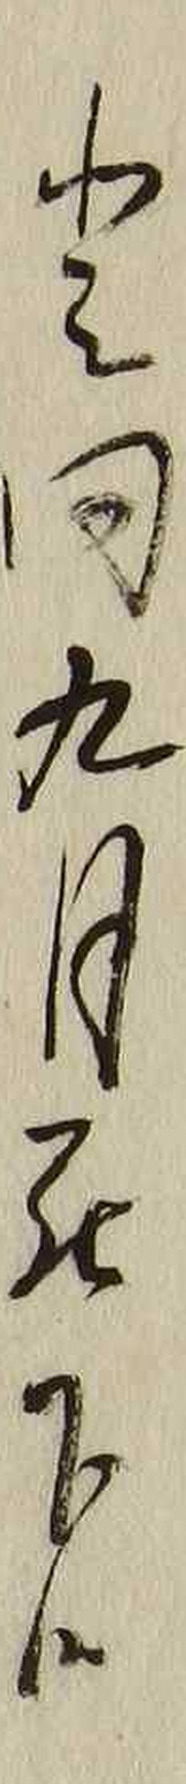登同九月罷下候
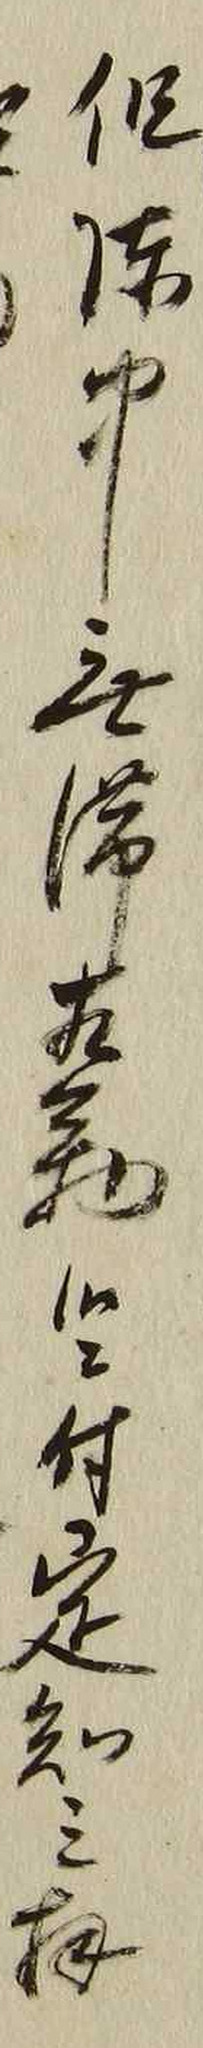但陣中無滞相勤候ニ付定知之拝
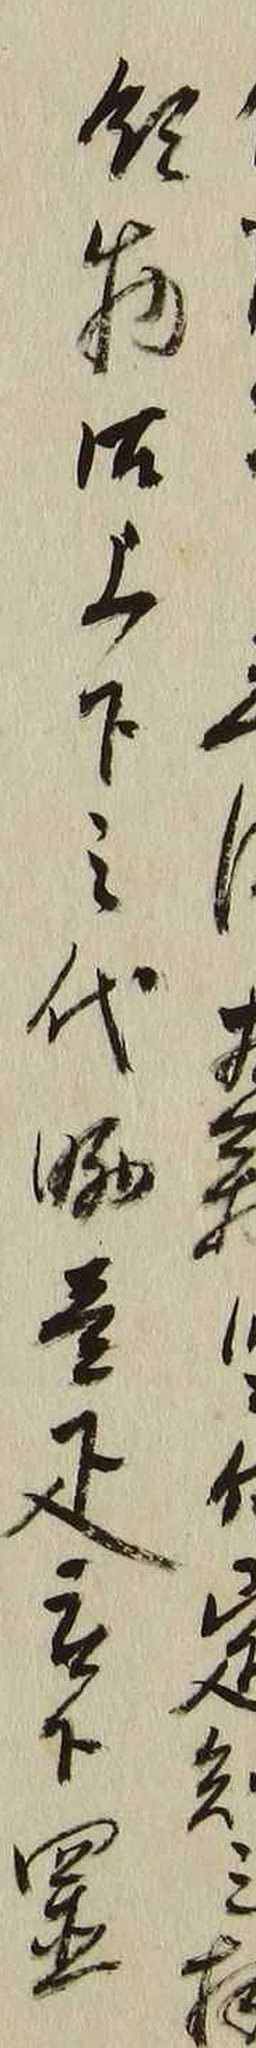領物御上下之代晒壱疋被下置
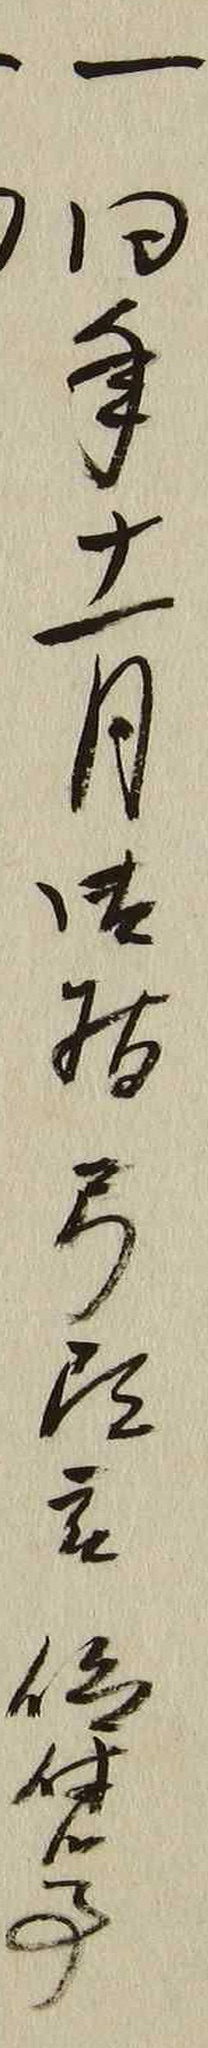一同年十一月御指弓頭被仰付候事
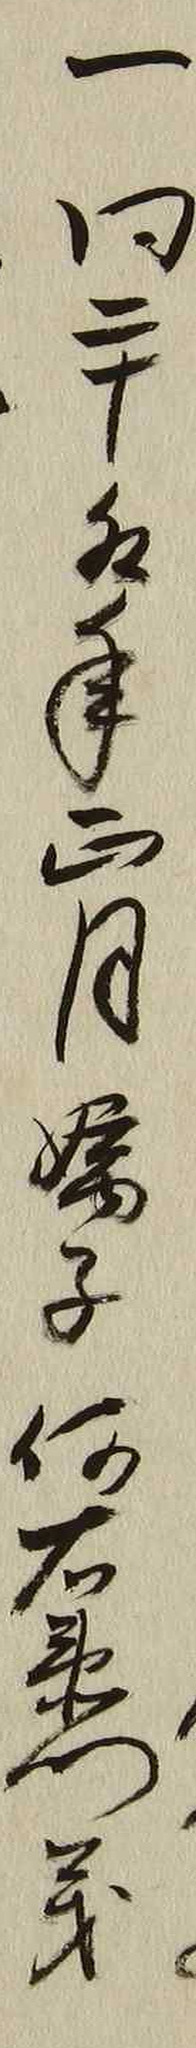一同二十卯年正月嫡子何右衛門義
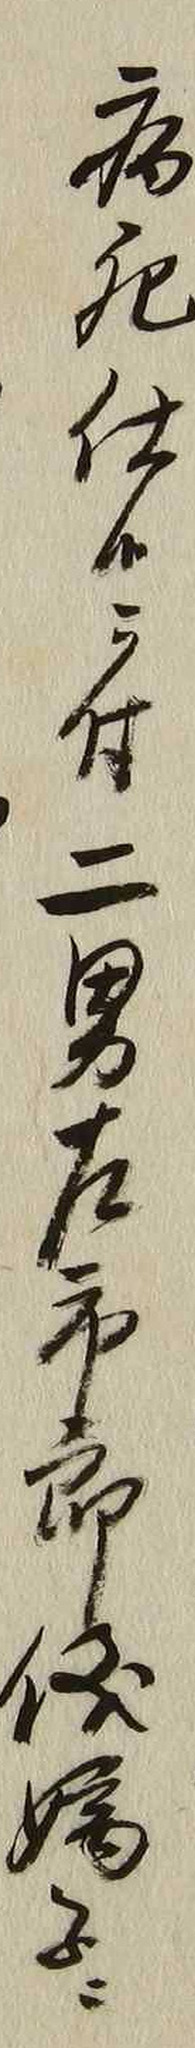病死仕候ニ付二男左市郎儀嫡子ニ
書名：諸士系譜　巻之349　も之部5
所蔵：会津若松市立会津図書館
